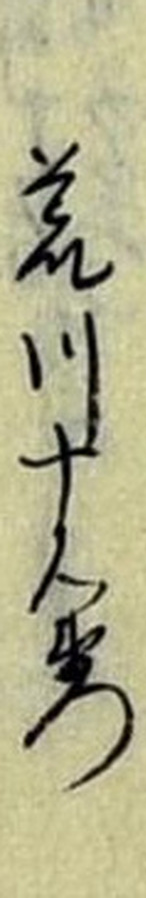荒川十右衛門
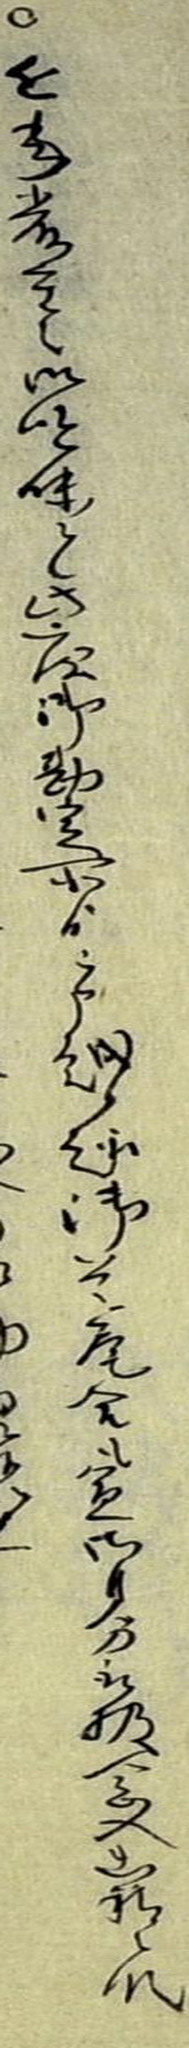〇近年厳重之御吟味ニ候此度御勘定所ゟ被申越候趣御首尾合も宜御自分取扱念入出精之段
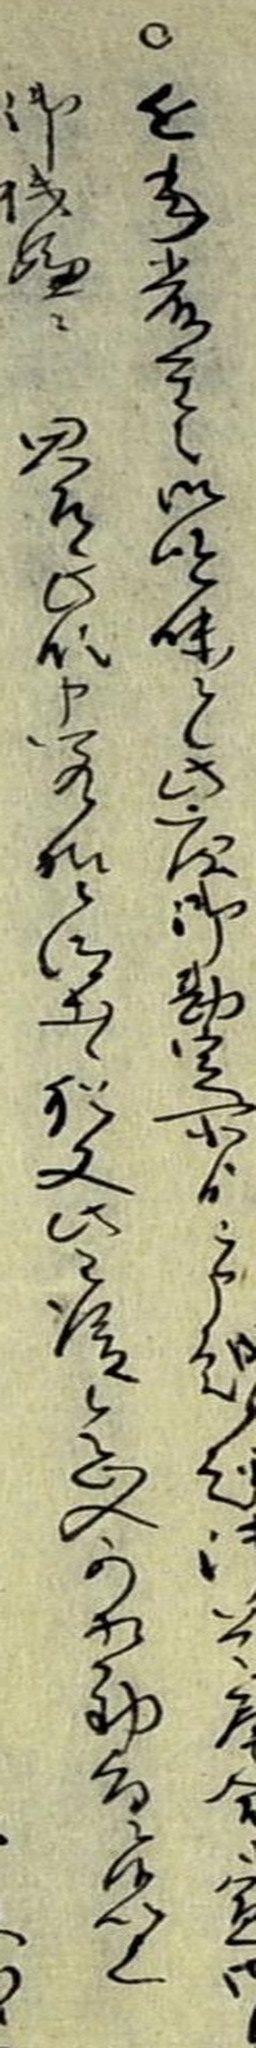御機嫌ニ思召候此段申聞候様被仰出候猶又此已後念入可相勤旨ニ候以上
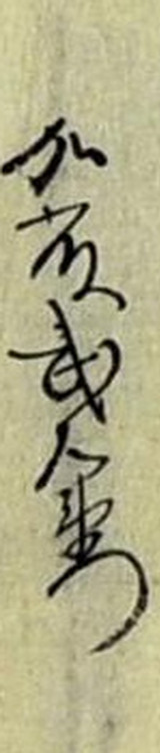加藤武右衛門
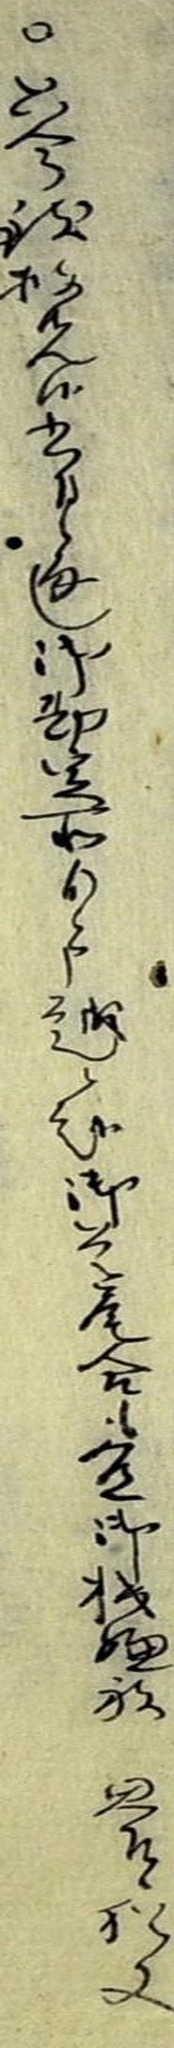〇只今致披見候書付之通御勘定所ゟ被申越候趣御首尾合も宜御機嫌被思召候猶又
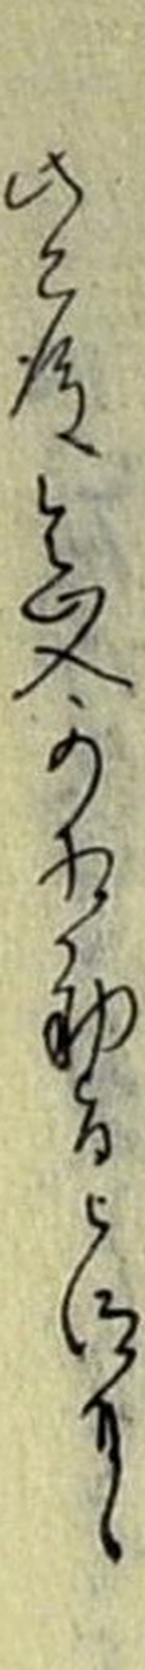此已後念入可相勤旨被仰付候

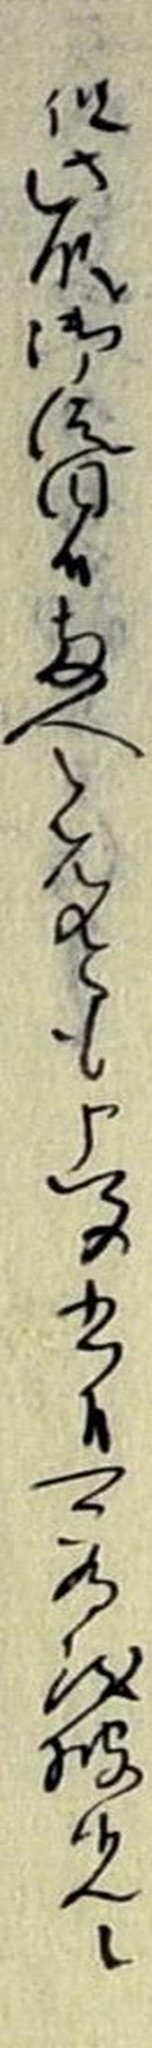但此段御徒目付両人之者共へも申聞書付可為致披見候
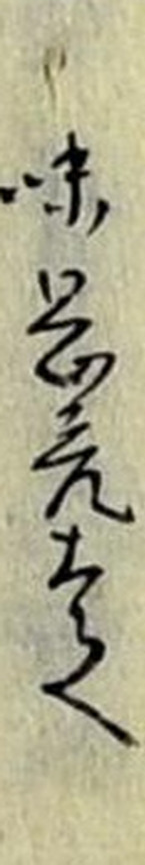味岡彦大夫
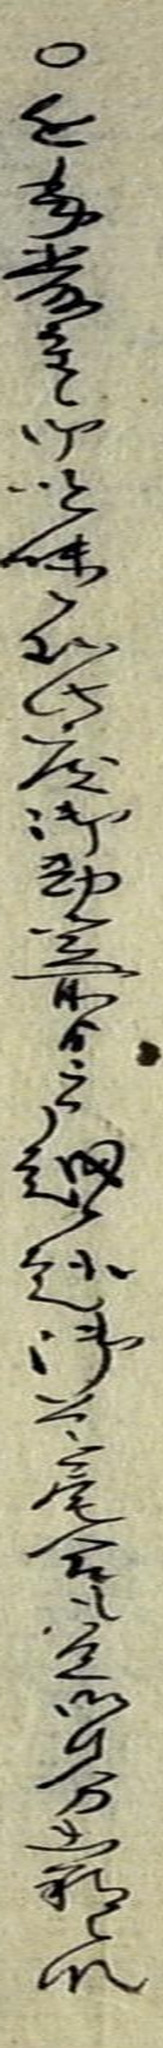〇近年厳重之御吟味候処此度御勘定所ゟ被申越候趣御首尾合も宜御自分出精之段
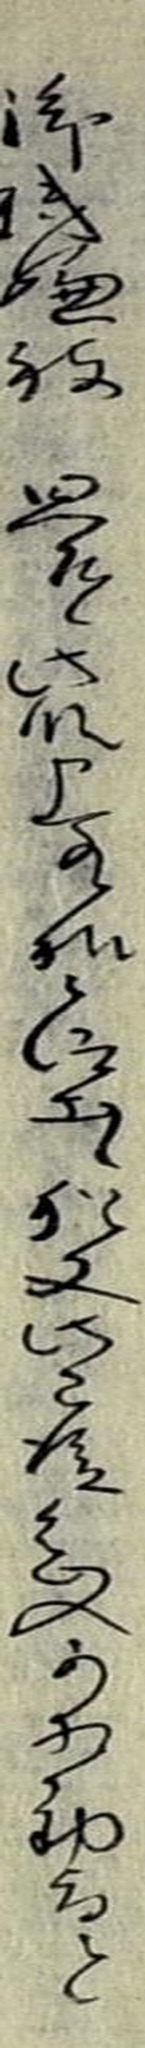御機嫌被思召候此段申聞候様被仰出候猶又此已後念入可相勤旨ニ候
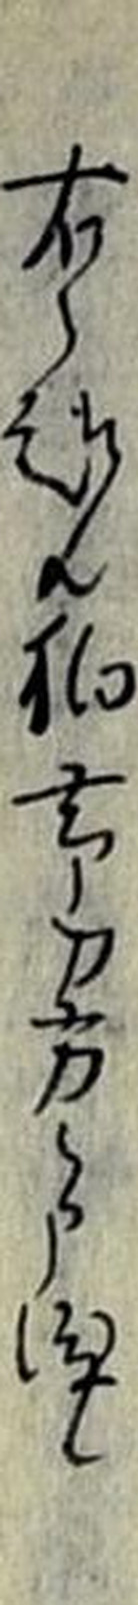右之趣共狛帯刀方被申渡候
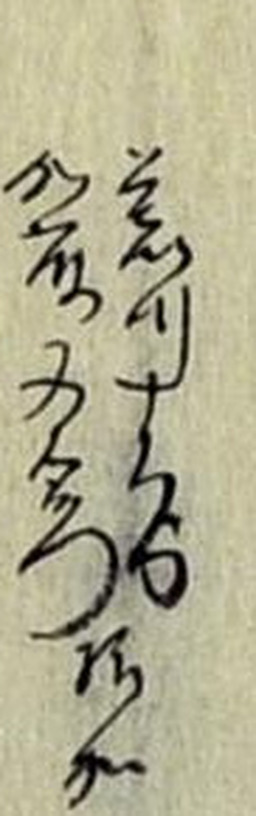加藤又右衛門指加
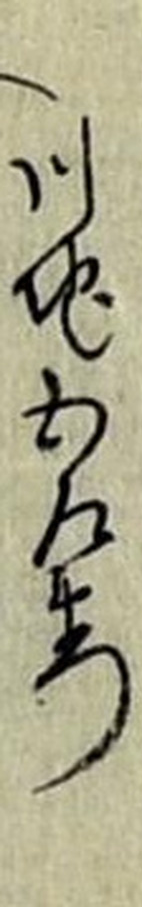川地五左衛門
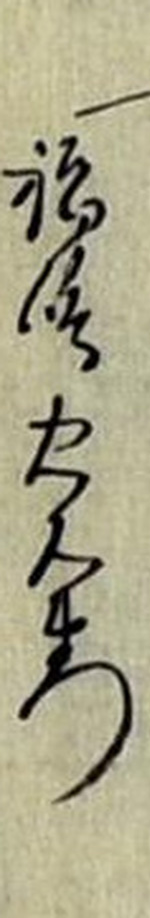福嶋忠右衛門
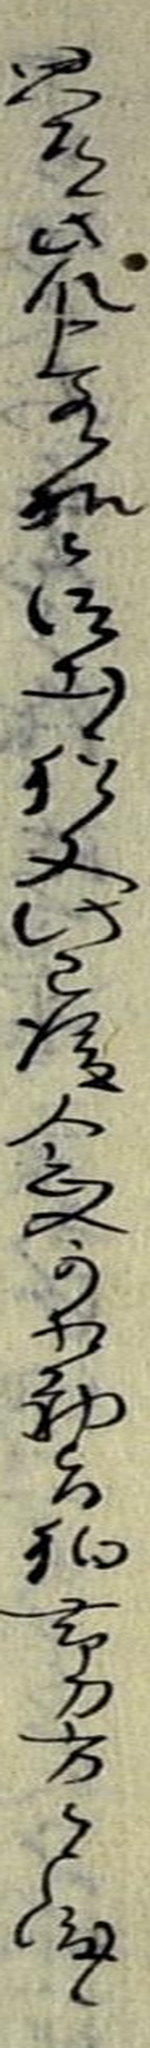思召候此段申聞候様被仰出候猶又此已後念入可相勤旨狛帯刀方被申渡候
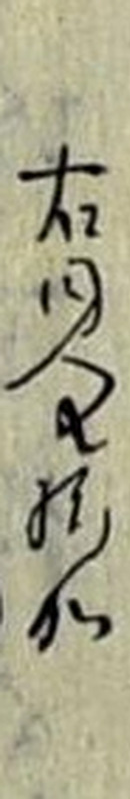右同人共指加
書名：命令之部 一
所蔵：福井県文書館 Fukui Prefectural Archives
